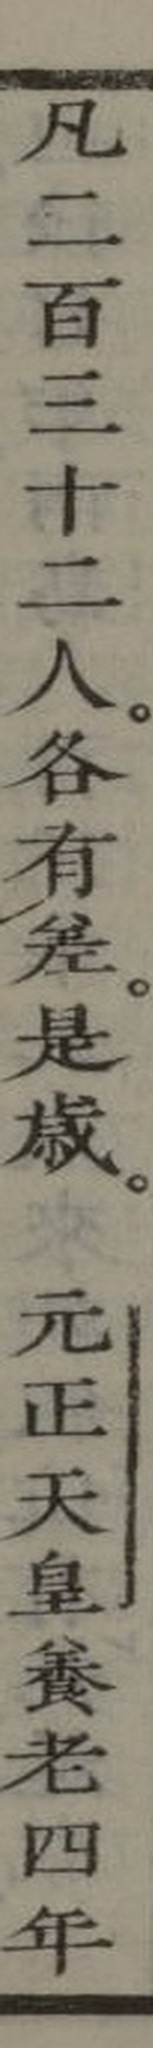凡二百三十二人。各有差。是歳。元正天皇養老四年

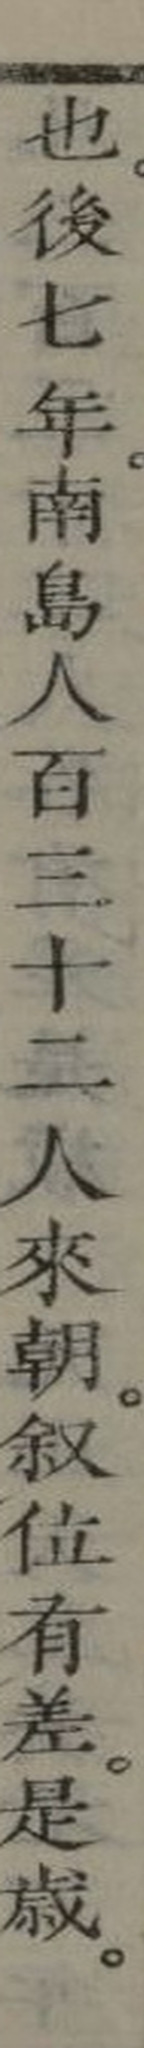也。後七年。南島人百三十二人來朝。叙位有差。是歳。
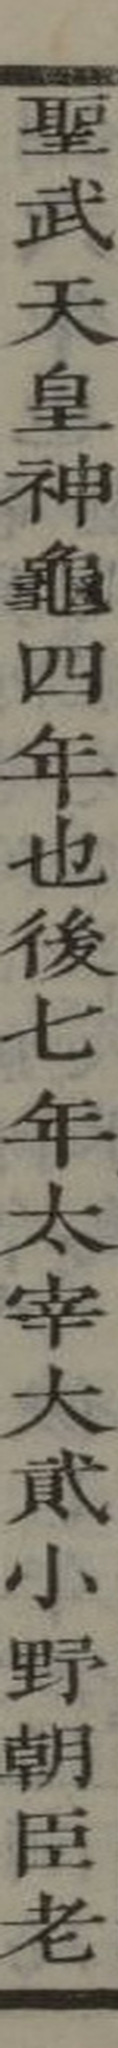聖武天皇神龜四年也。後七年。太宰大貮小野朝臣老
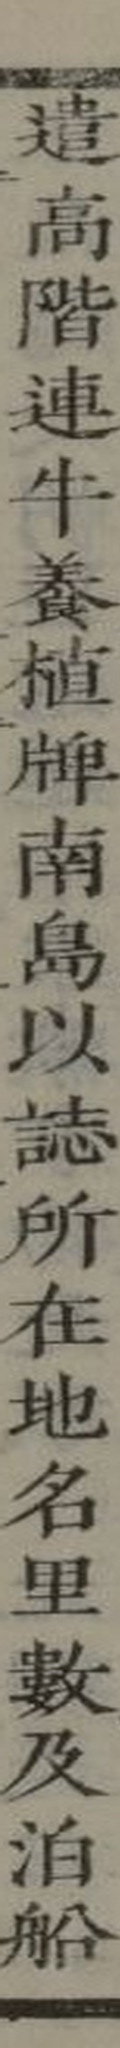遣高階連牛養。植牌南島。以誌所在地名里數。及泊船
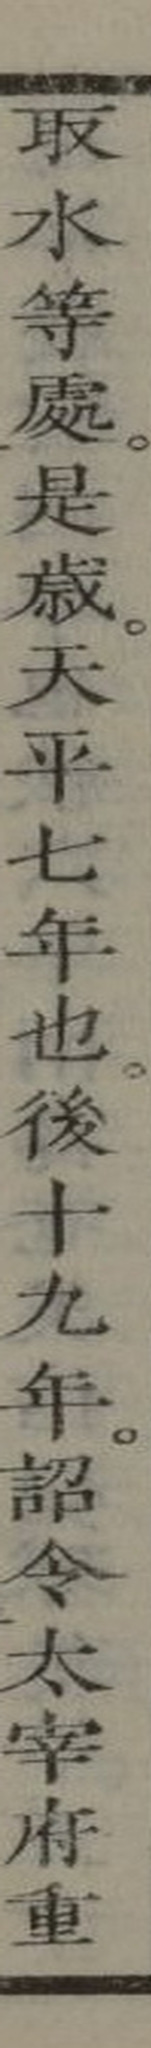取水等處。是歳。天平七年也。後十九年。詔令太宰府重
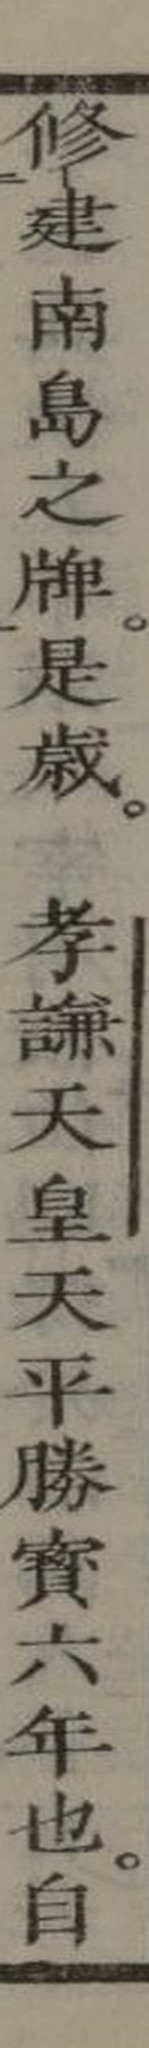修-建南島之牌。是歳。孝謙天皇天平勝寳六年也。自
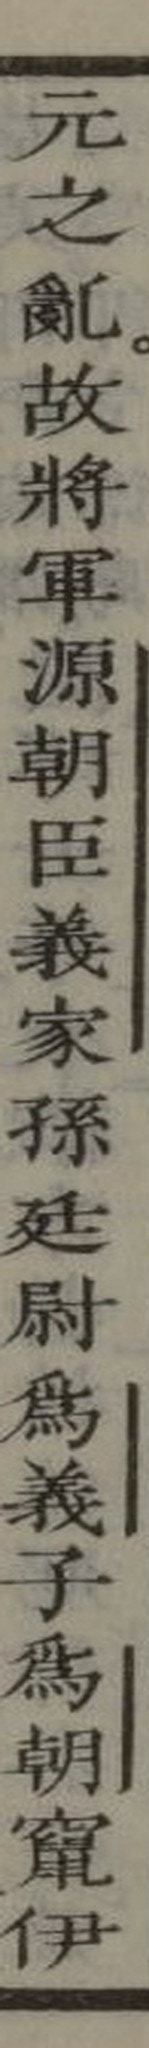元之亂。故將軍源朝臣義家孫廷尉爲義子爲朝竄伊
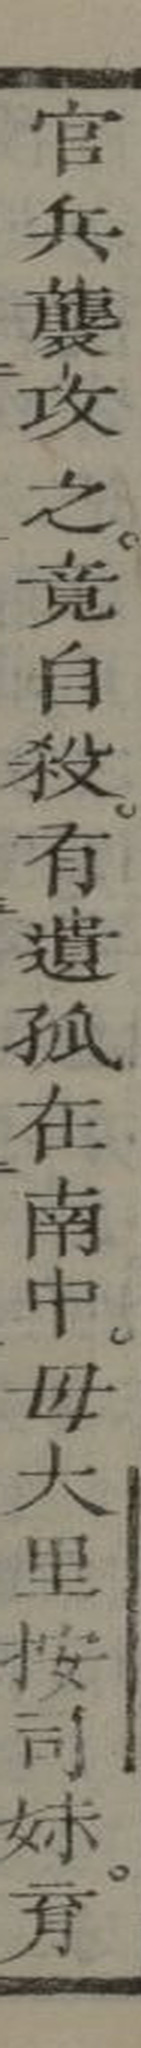官兵襲-攻之。竟自殺。有遺孤在南中。母大里按司妹。育
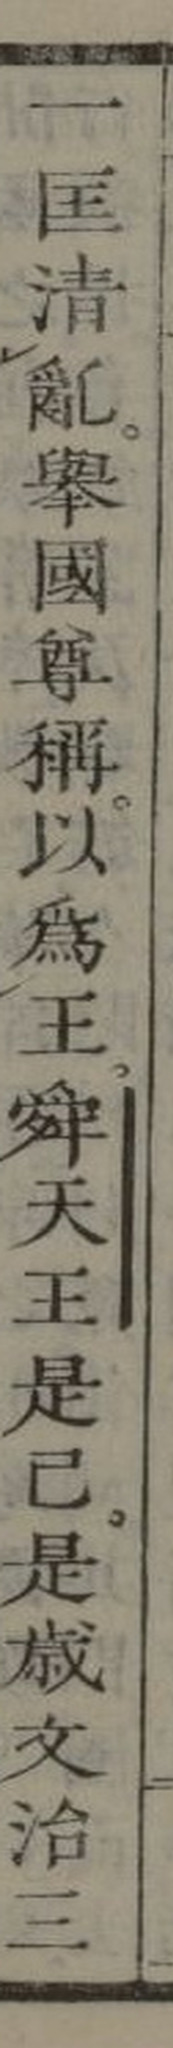一匡清亂。舉國尊稱。以爲王。舜天王是已。是歳文治三

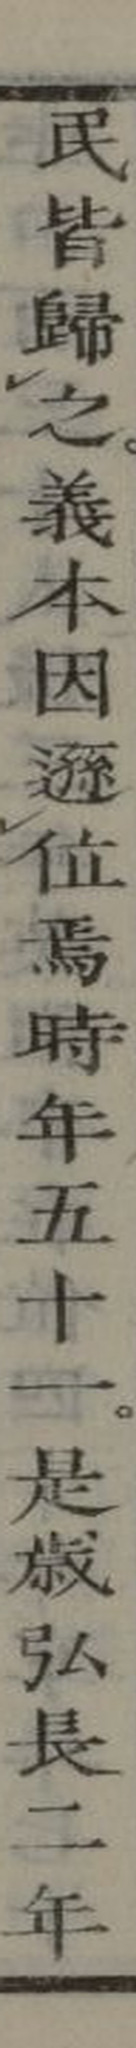民皆歸之。義本因遜位焉時年五十一。是歳弘長二年
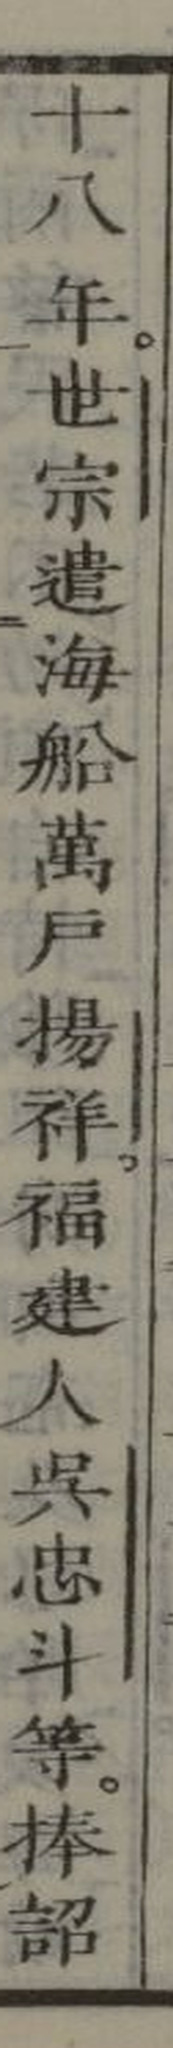十八年。世宗遣海船萬戸楊祥。福建人呉忠斗等。捧詔
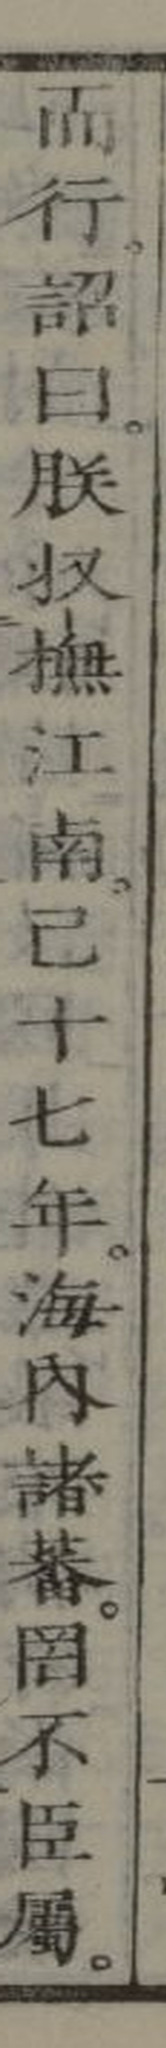而行。詔曰。朕収-撫江南。已十七年。海内諸蕃。罔不臣屬。
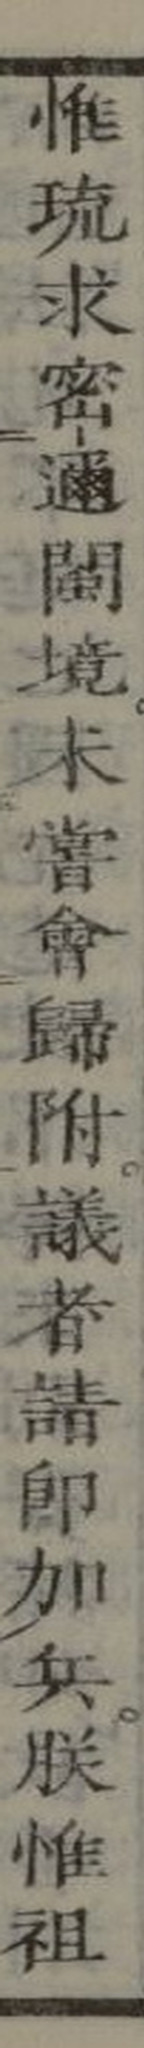惟琉求密-邇閩境。未嘗會歸附。議者請卽加兵。朕惟祖

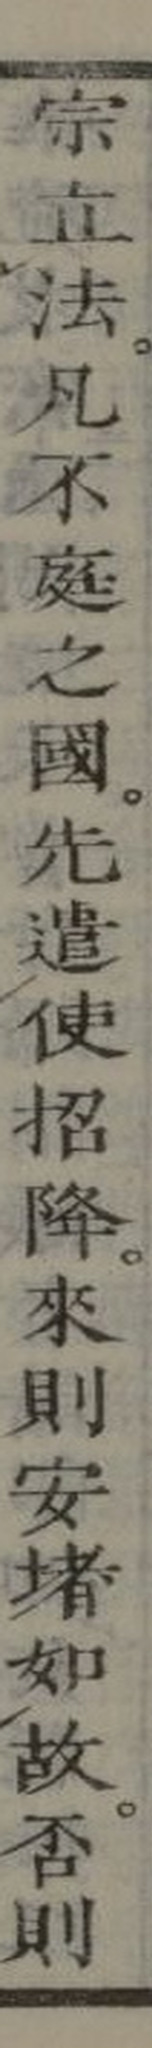宗立法。凡不庭之國。先遣使招降。來則安堵如故。否則
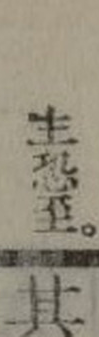主恐至。
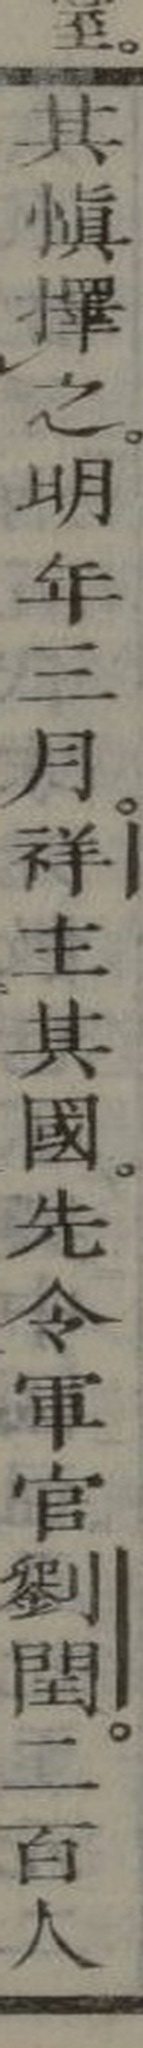其愼擇之。明年三月。祥主其國。先令軍官劉閏。二百人
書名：南島志 呂
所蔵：University of the Ryukyus Library
